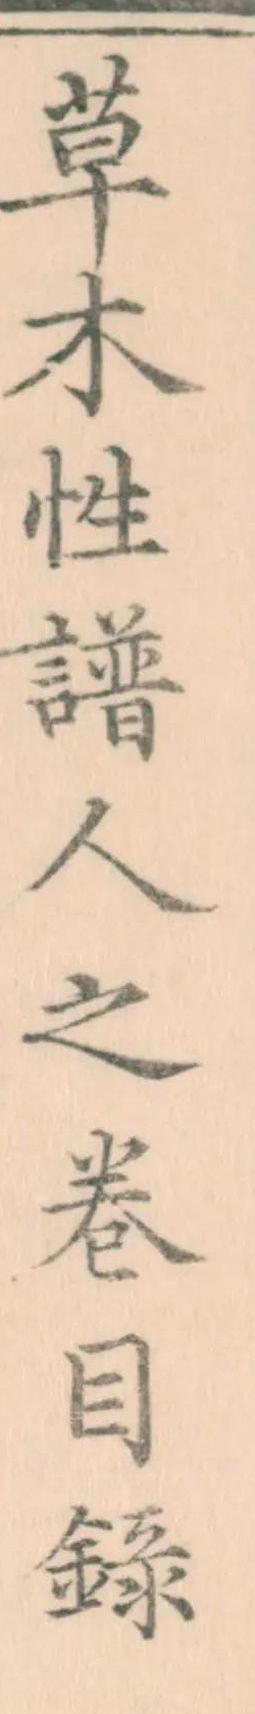草木性譜人之巻目録
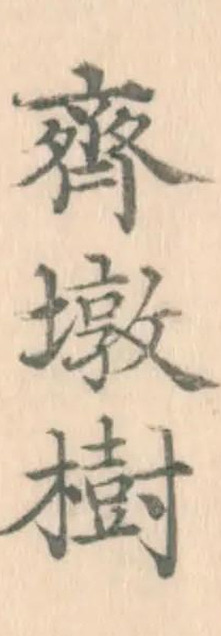齊墩樹

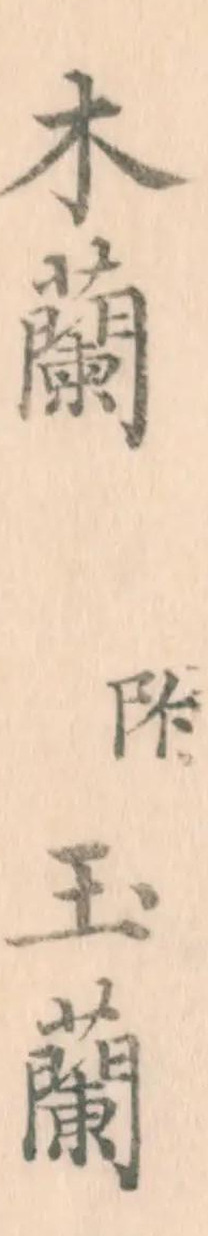木蘭附玉蘭
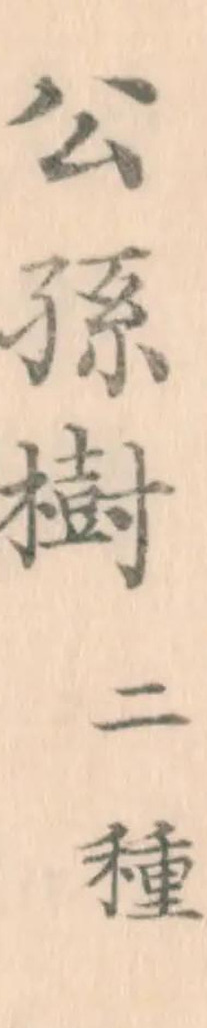公孫樹二種
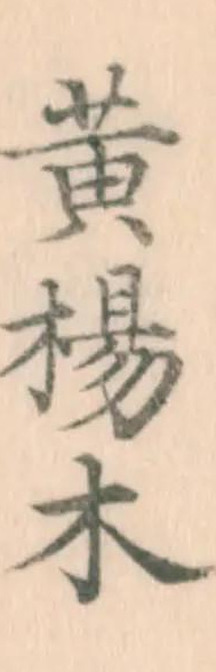黄楊木
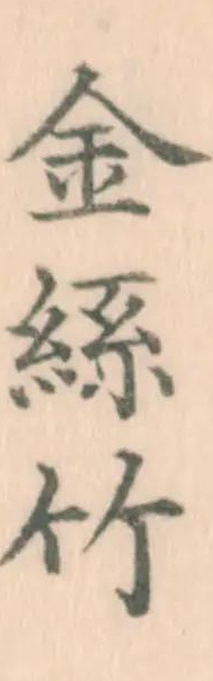金絲竹
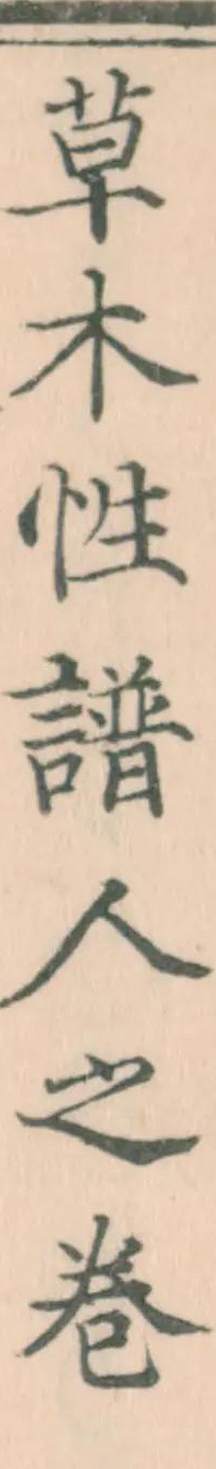草木性譜人之巻
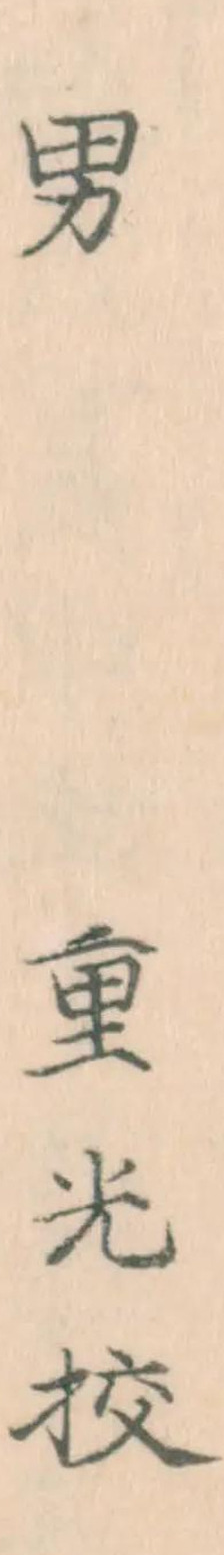男重光校
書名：草木性譜 3巻. [3]
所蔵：国立国会図書館 National Diet Library, JAPAN
